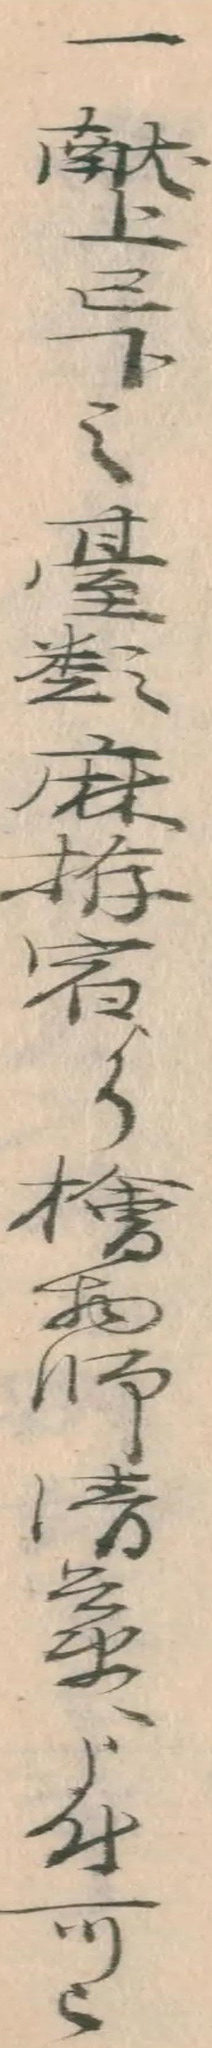一献上已下之䑓類麻拵宿より檜物師清兵衛へ申付可被
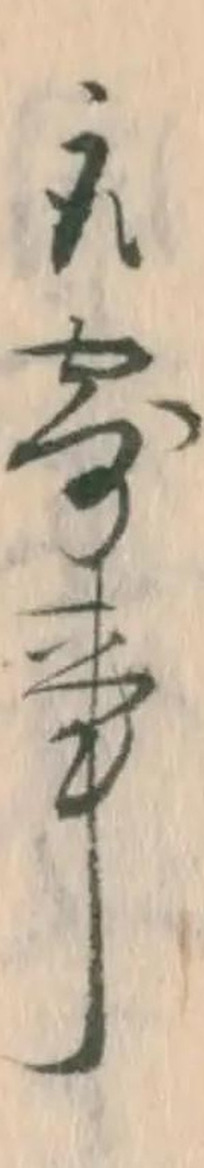取寄事
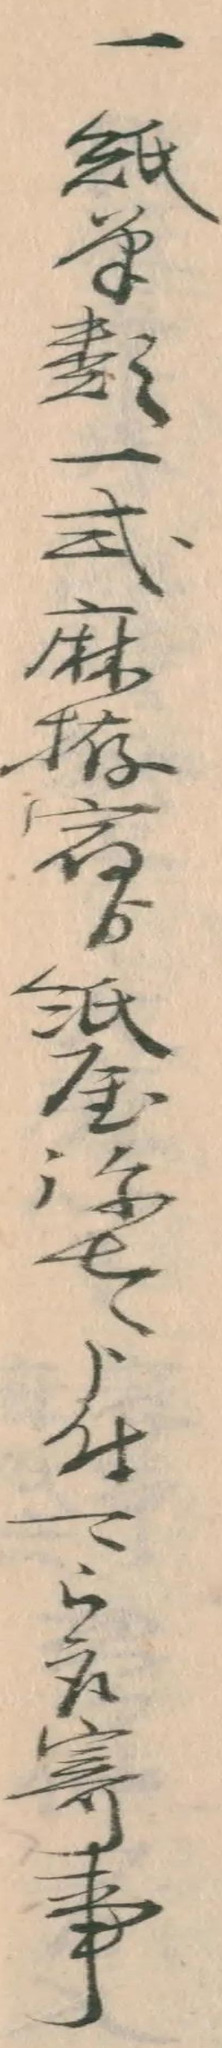一紙筆類一式麻拵宿ゟ紙屋弥七へ申付可被取寄事
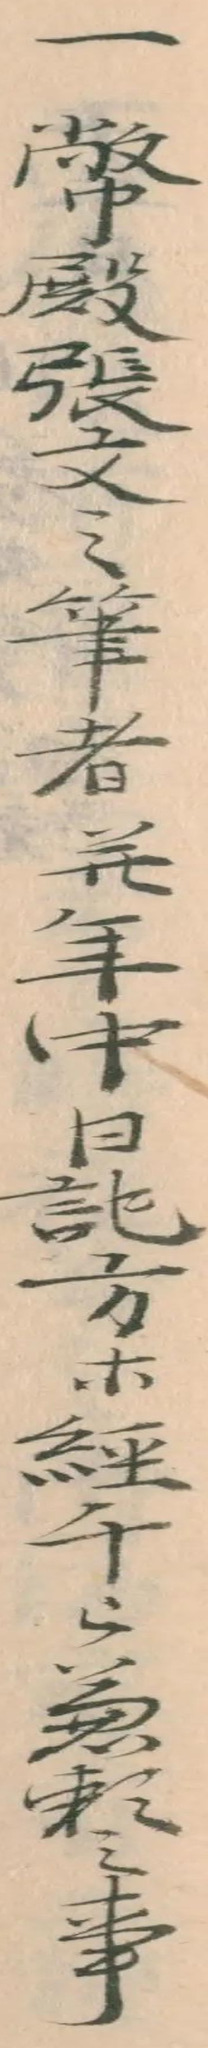一幣殿張文之筆者并年中日記方等經千被兼頼之事
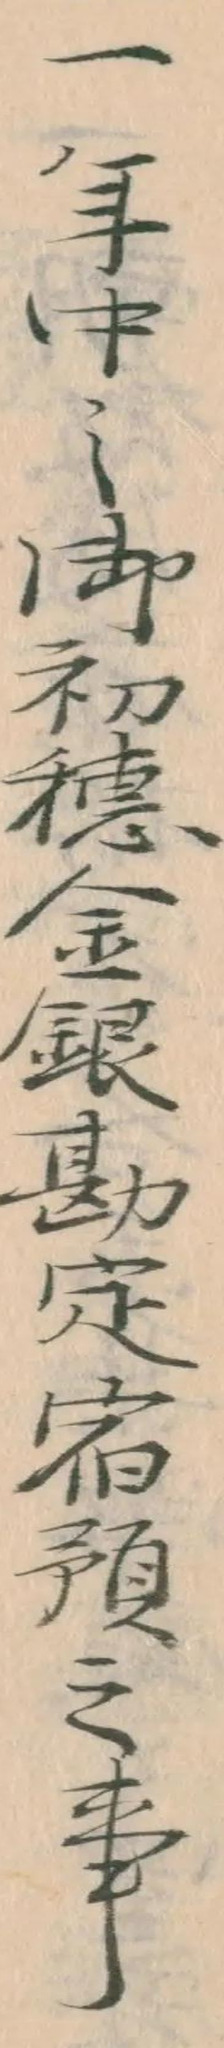一年中之御初穂金銀勘定宿預之事
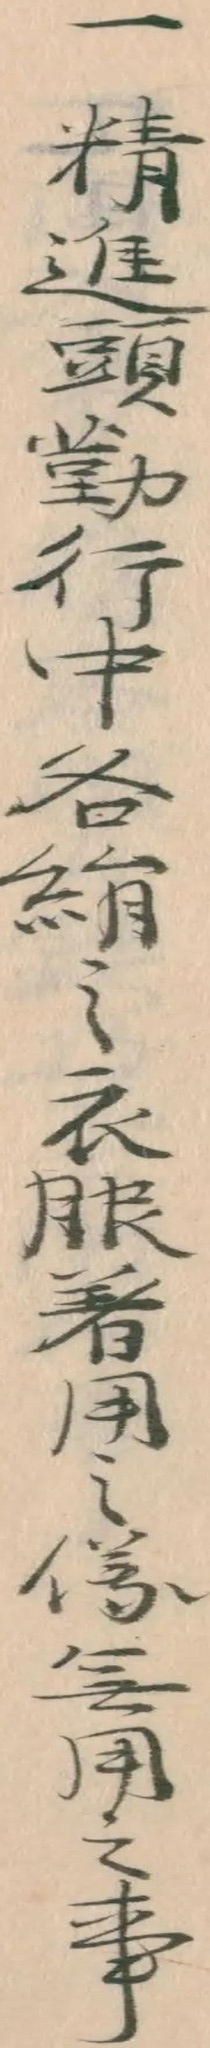一精進頭勤行中各絹之衣服着用之儀無用之事
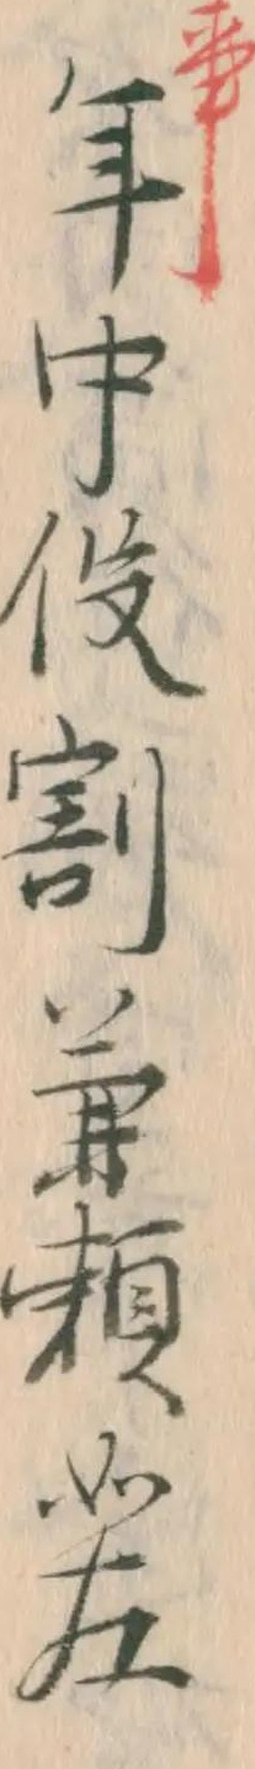年中役割兼頼如左
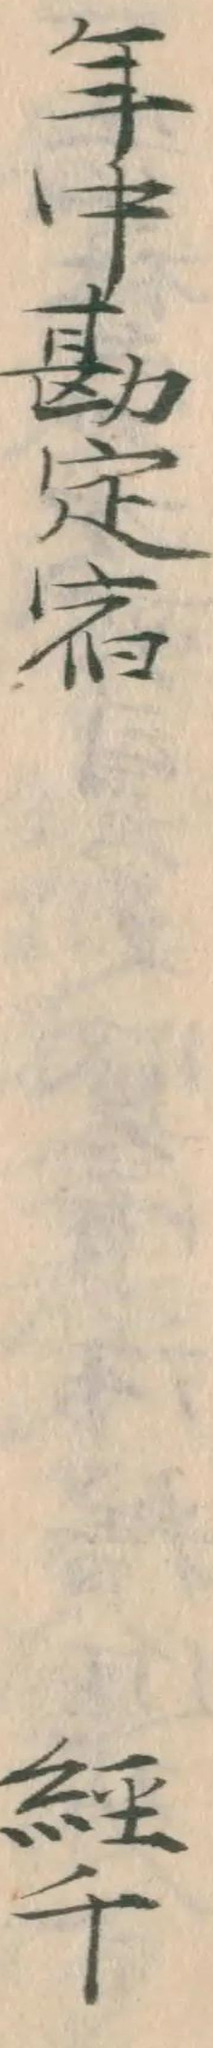年中勘定宿経千
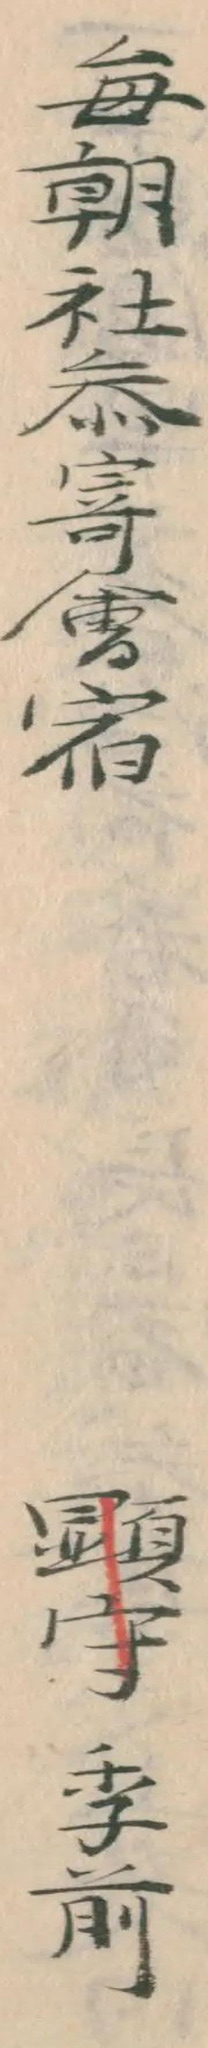毎朝社参寄會宿顕守季前
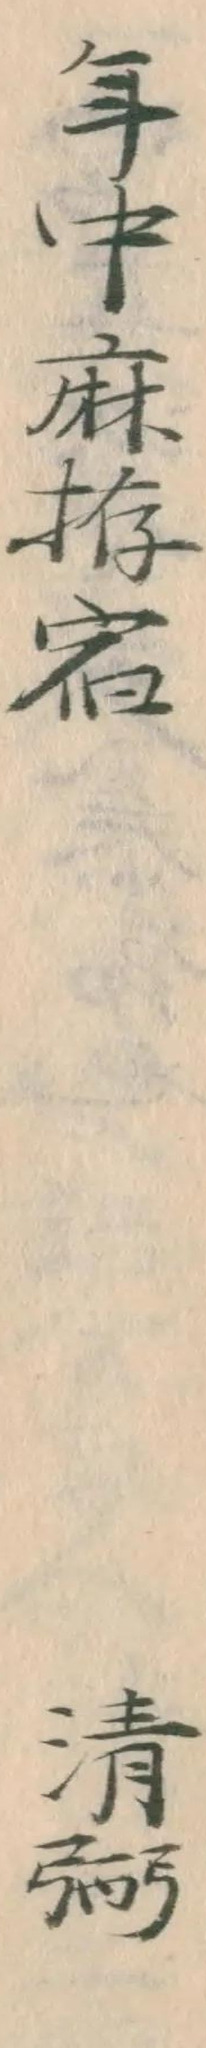年中麻拵宿清弼
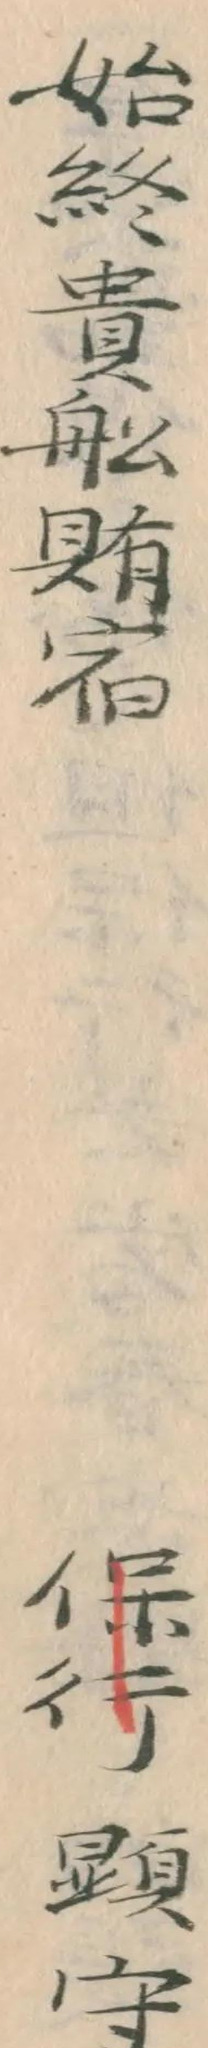始終貴舩賄宿保行顕守
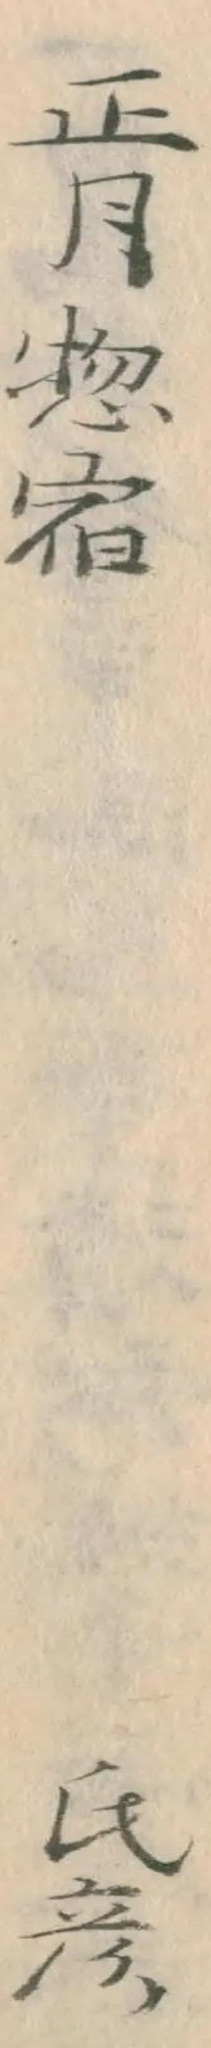正月惣宿氏彦
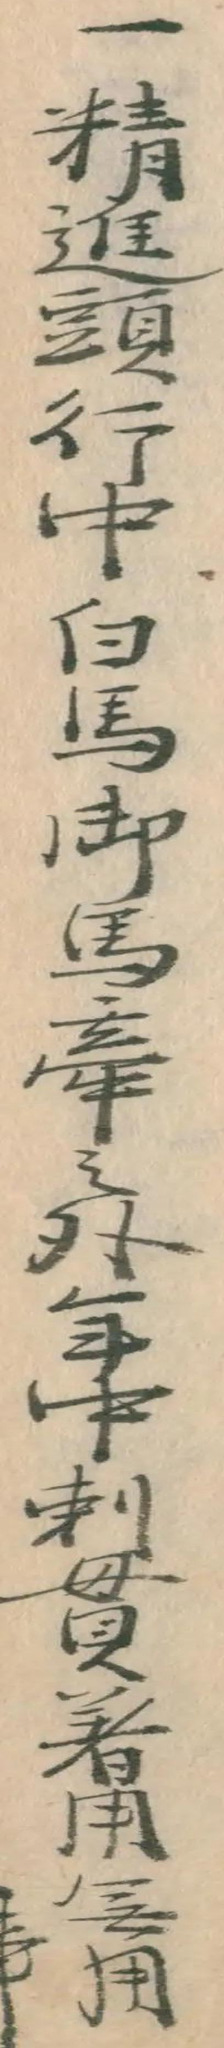一精進頭行中白馬御馬牽之外年中刺貫着用無用之事

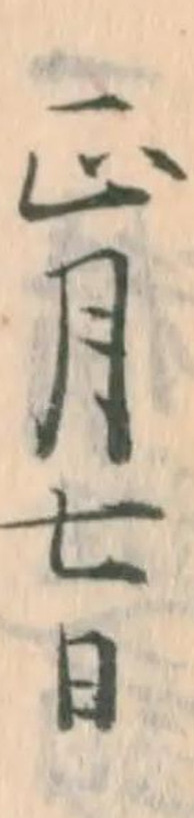正月七日
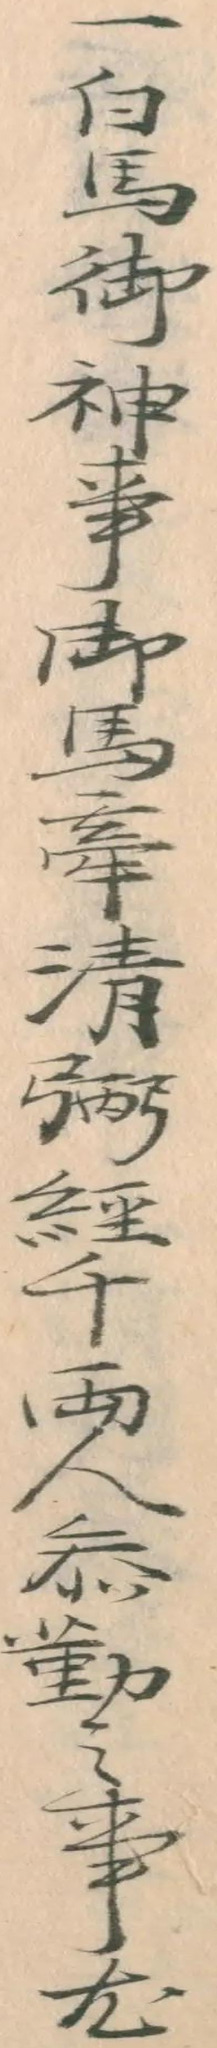一白馬御神事御馬牽清弼経千両人参勤之事尤
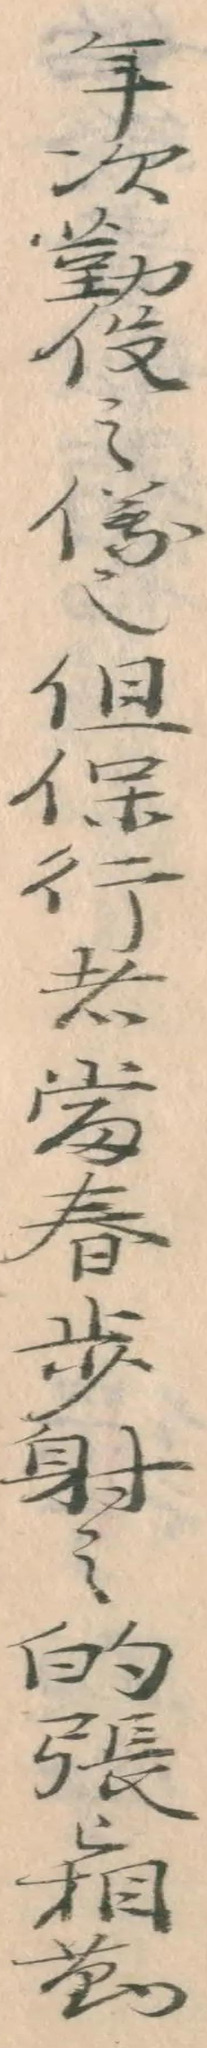年次勤役之儀也但保行者當春歩射之的張被相勤
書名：賀茂社記録. 第72冊
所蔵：国立国会図書館 National Diet Library, JAPAN
